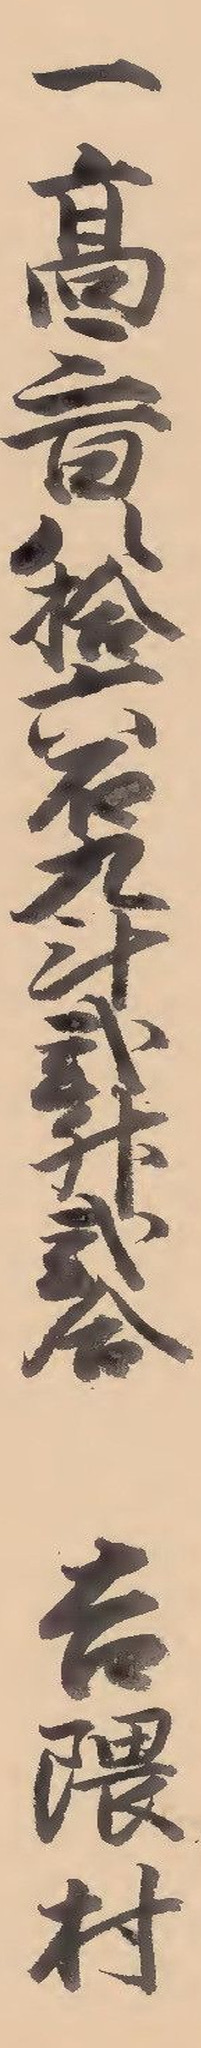一高三百八拾六石九斗弐升弐合吉隈村
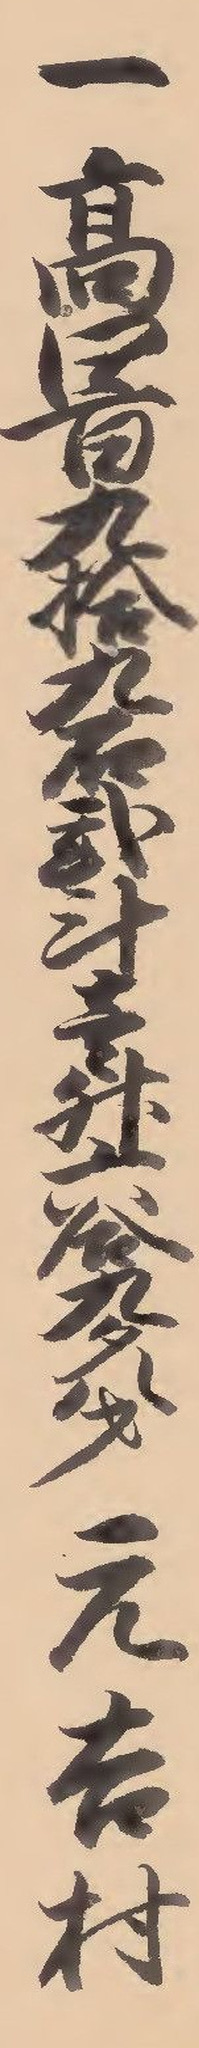一高四百九拾九石弐斗壱升六合九勺八才元吉村
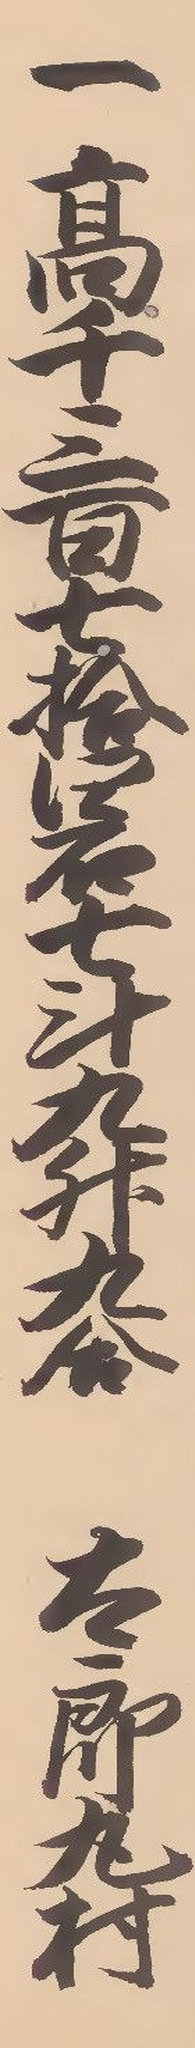一高千三百七拾四石七斗九升九合太郎丸村
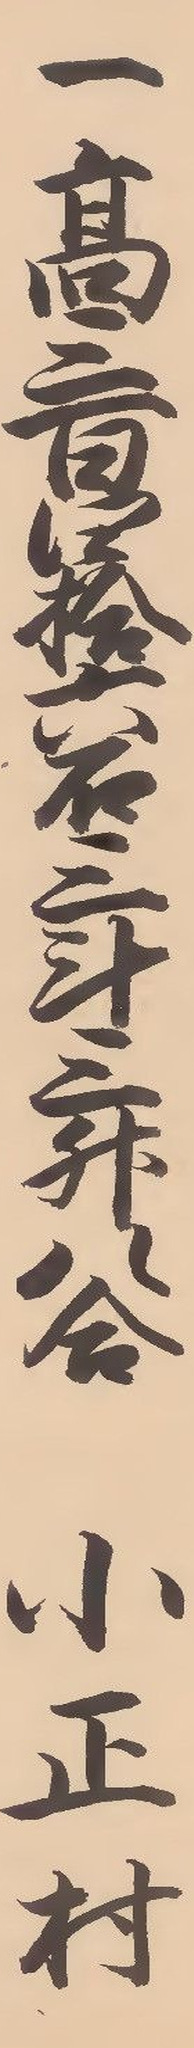一高三百四拾六石三斗三升八合小正村
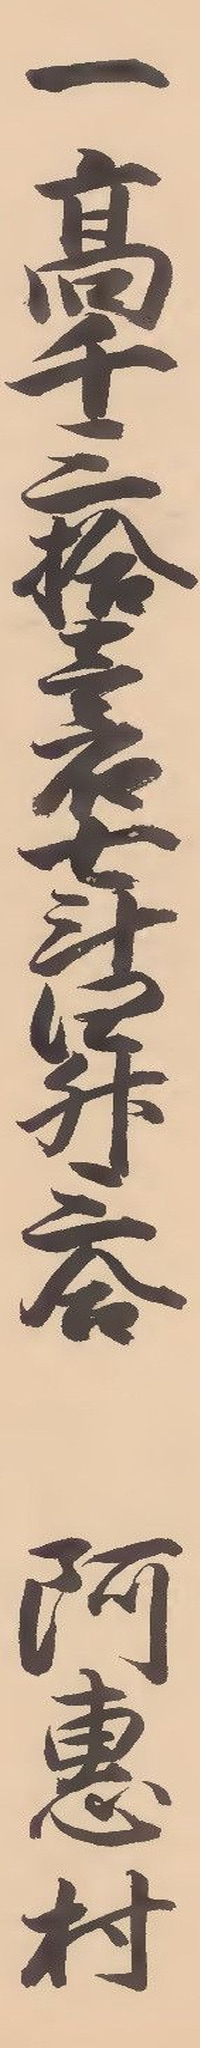一高千三拾壱石七斗四升三合阿恵村
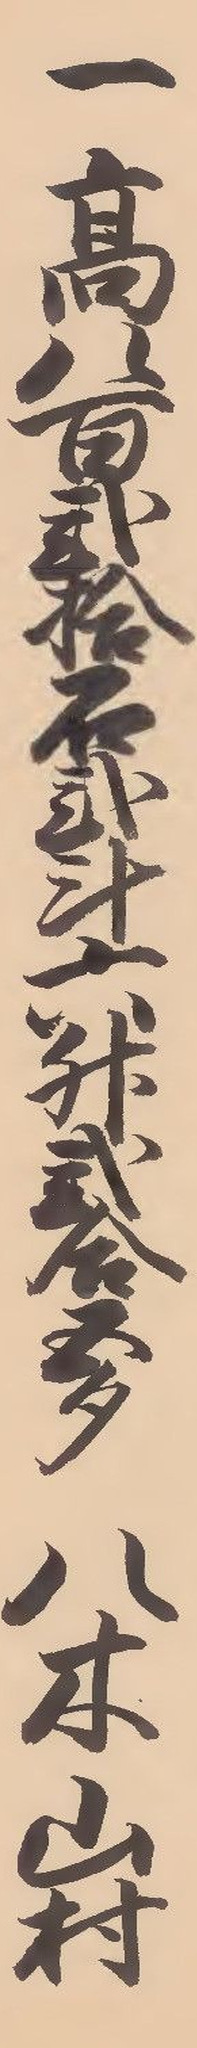一高八百弐拾石弐斗六升弐合五勺八木山村

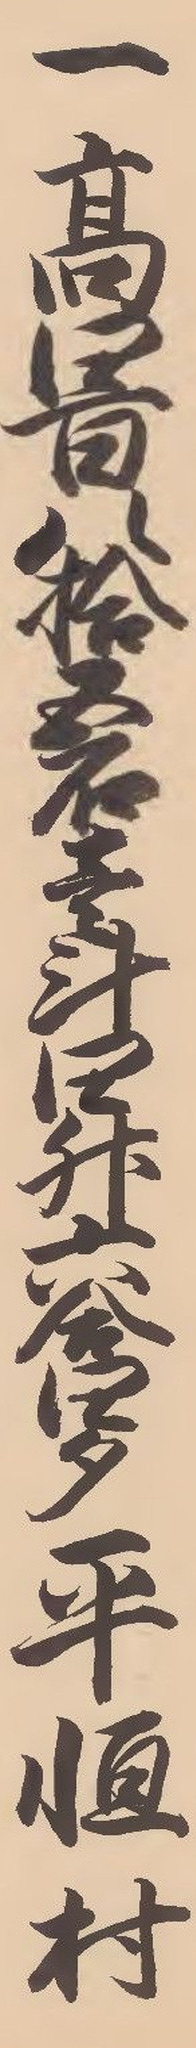一高四百八拾五石壱斗四升六合四勺平恒村
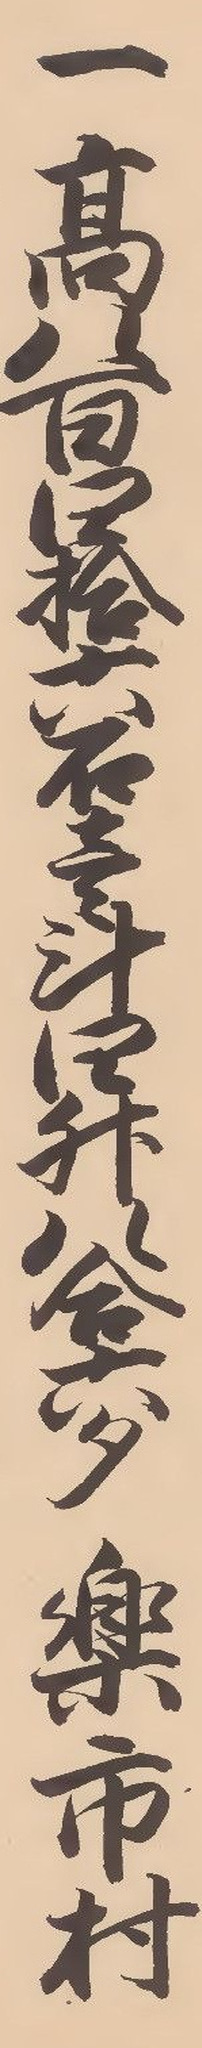一高八百四拾六石壱斗四升八合六勺楽市村
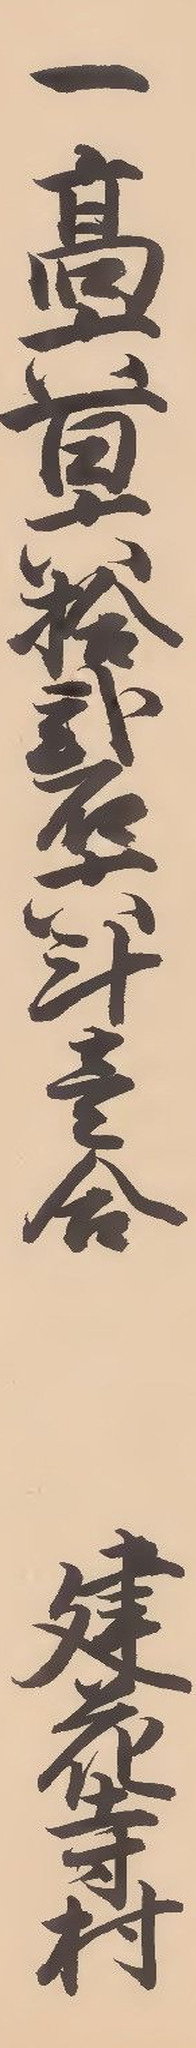一高六百六拾弐石六斗壱合建花寺村
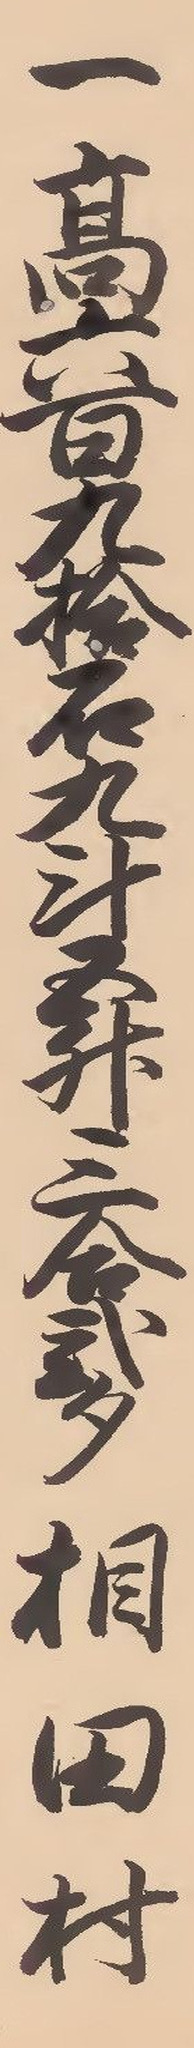一高六百九拾石九斗五升三合弐勺相田村
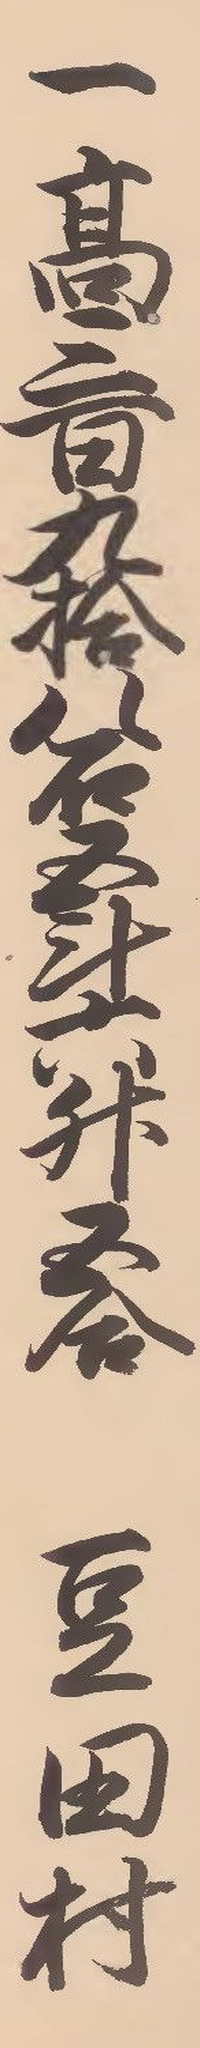一高三百九拾八石五斗六升五合豆田村
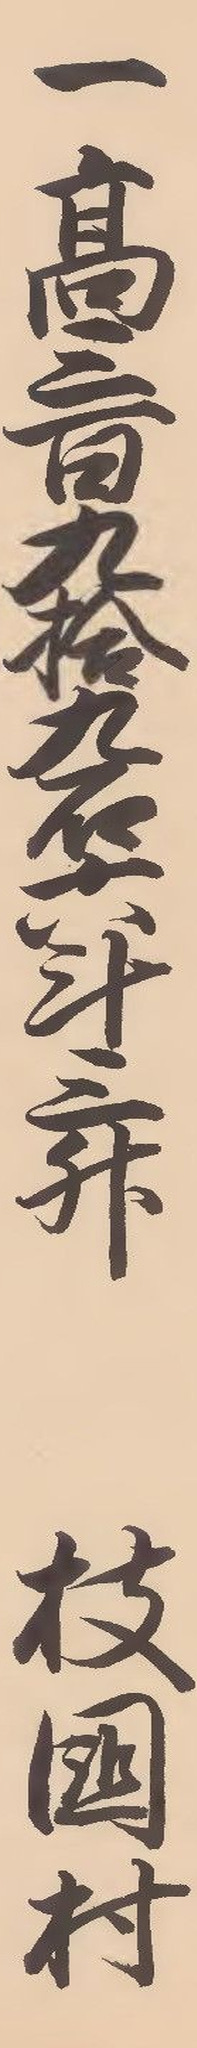一高三百九拾九石六斗三升枝国村
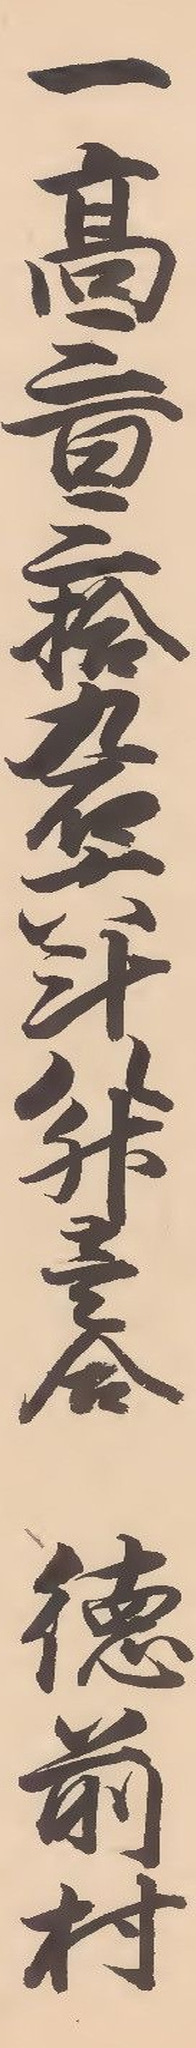一高三百三拾九石六斗八升壱合徳前村
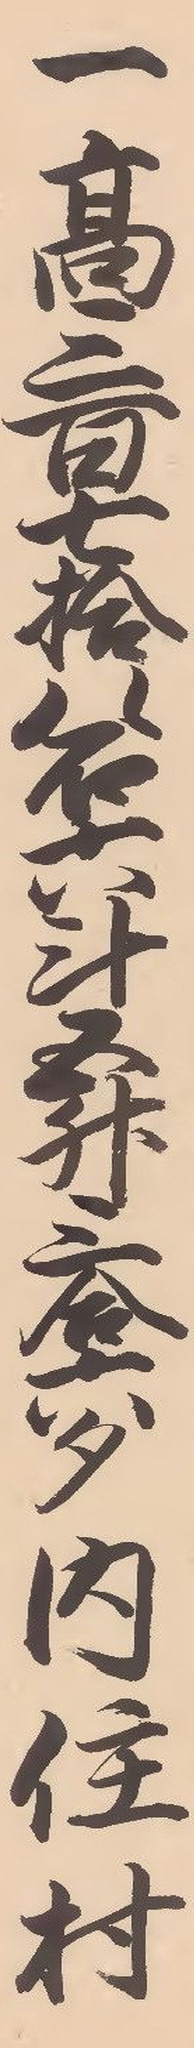一高三百七拾八石六斗五升三合六勺内住村

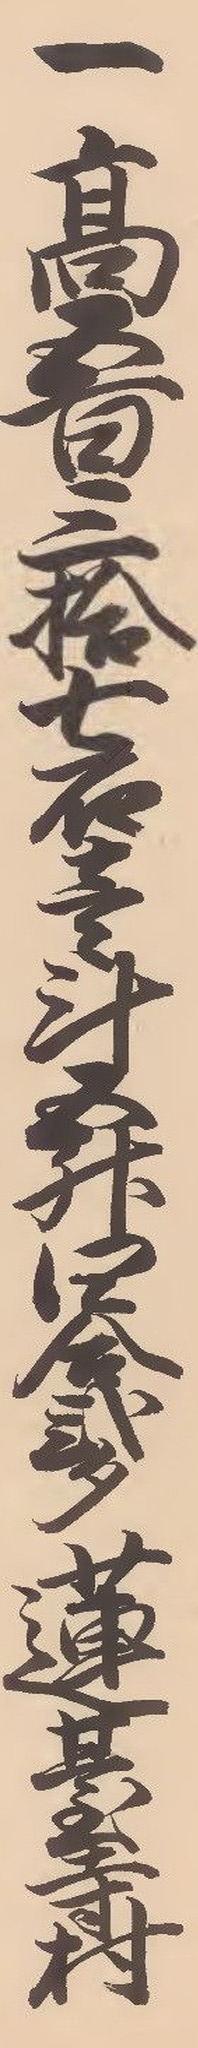一高五百三拾七石壱斗五升四合弐勺蓮台寺村
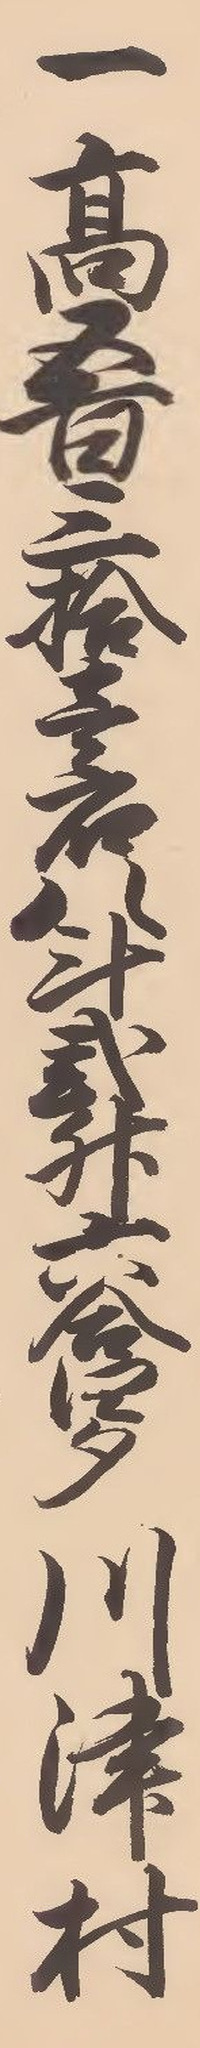一高五百三拾壱石八斗弐升六合四勺川津村
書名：筑前国郷帳
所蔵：国立公文書館 National Archives of Japan
